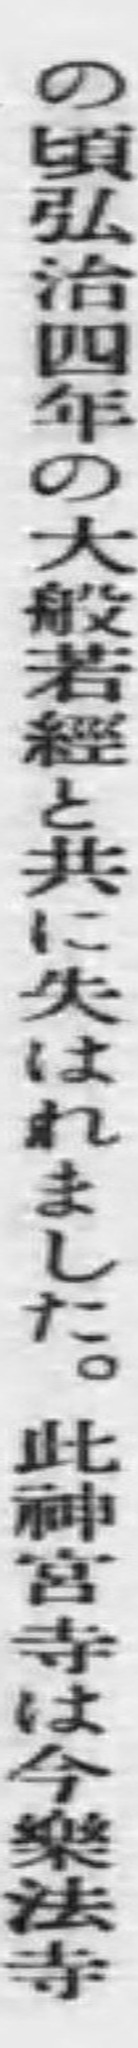の頃弘治四年の大般若経と共に失はれました。此神宮寺は今楽法寺
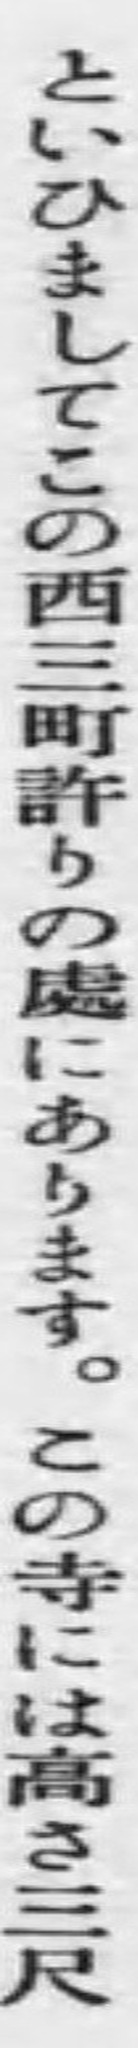といひましてこの西三町許りの処にあります。この寺には高さ三尺
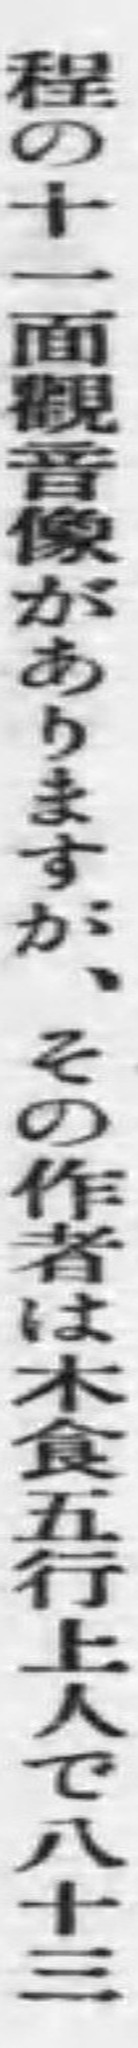程の十一面観音像がありますが、その作者は木食五行上人で八十三
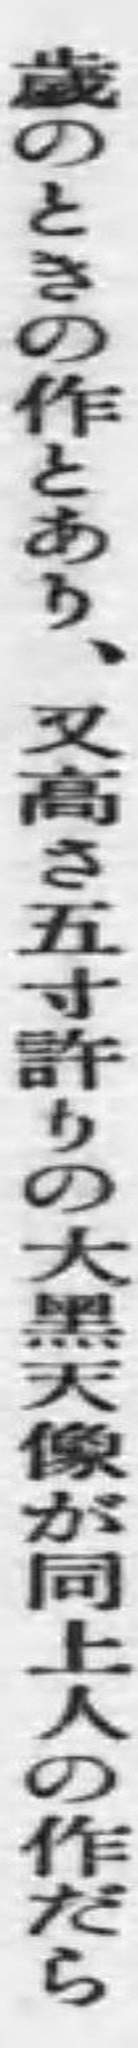歳のときの作とあり、又高さ五寸許りの大黒天像が同上人の作だら
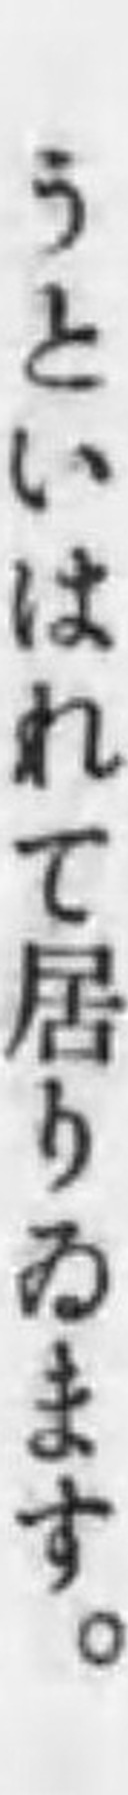うといはれて居りゐます。
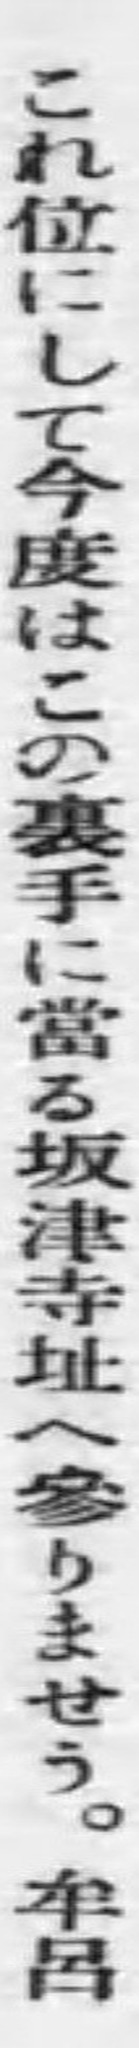これ位にして今度はこの裏手に当る坂津寺址へ参りませう。牟呂
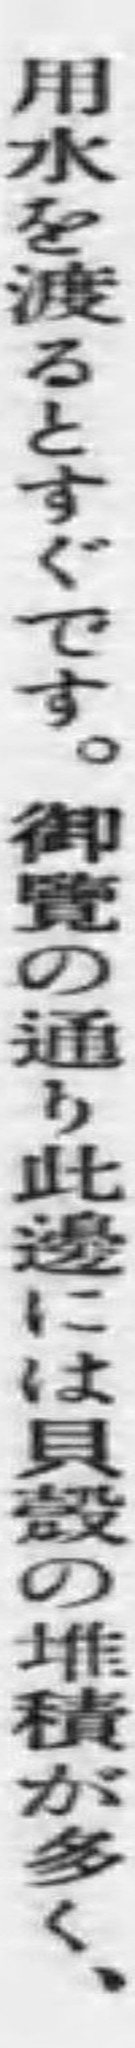用水を渡るとすぐです。御覧の通り此辺には貝殻の堆積が多く、
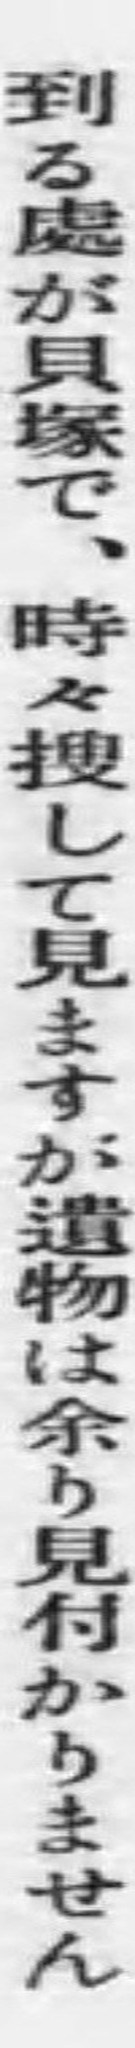到る処が貝塚で、時々捜して見ますが遺物は余り見付かりません
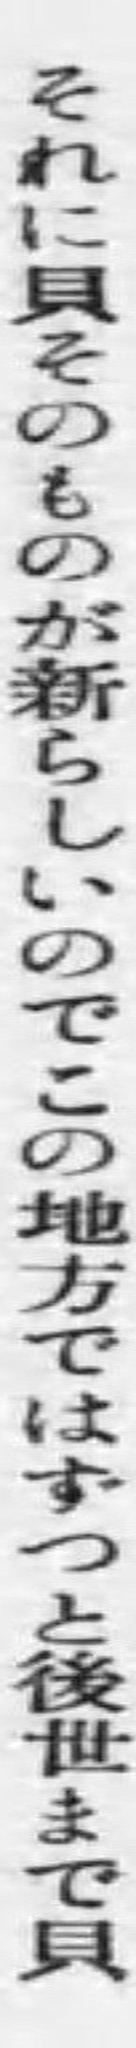それに貝そのものが新らしいのでこの地方ではずつと後世まで貝
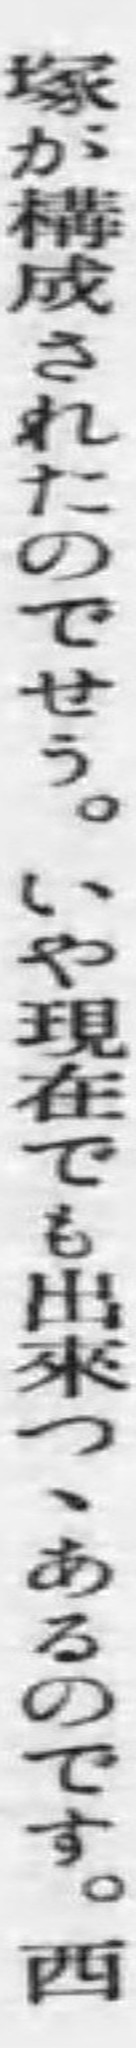塚が構成されたのでせう。いや現在でも出来つゝあるのです。西
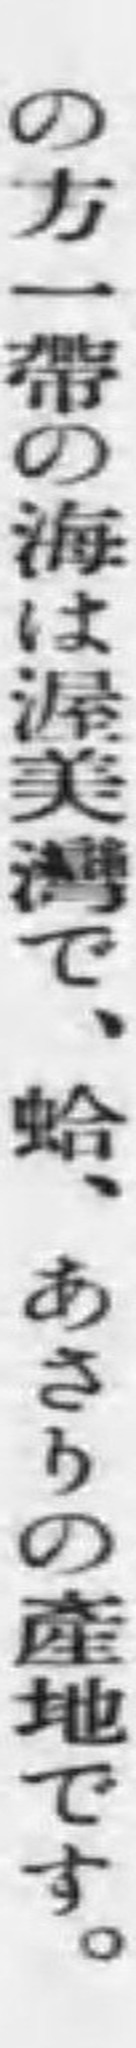の方一帯の海は渥美湾で、蛤、あさりの産地です。
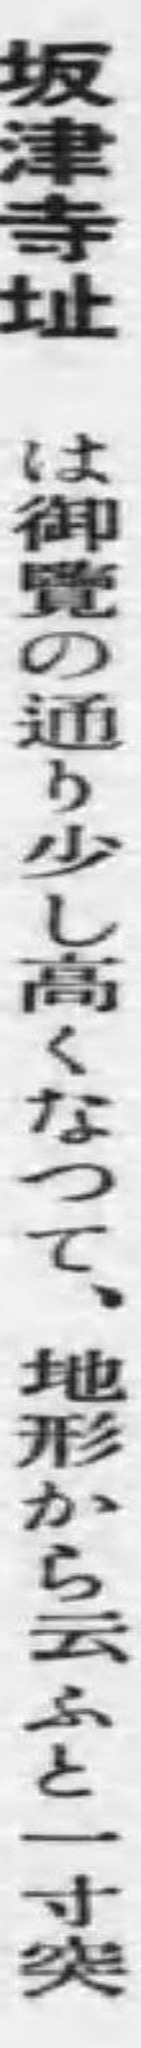坂津寺址は御覧の通り少し高くなつて、地形から云ふと一寸突
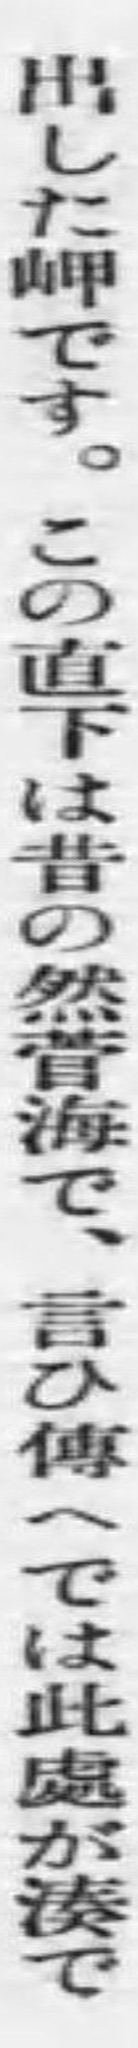出した岬です。この直下は昔の然菅海で、言ひ伝へでは此処が湊で
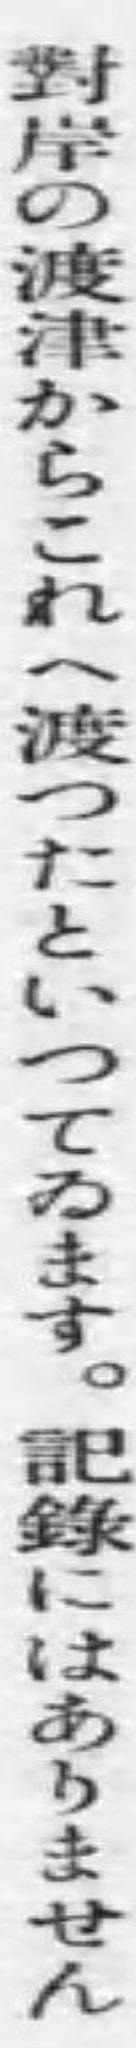対岸の渡津からこれへ渡つたといつてゐます。記録にはありません
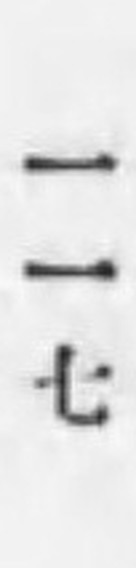一一七

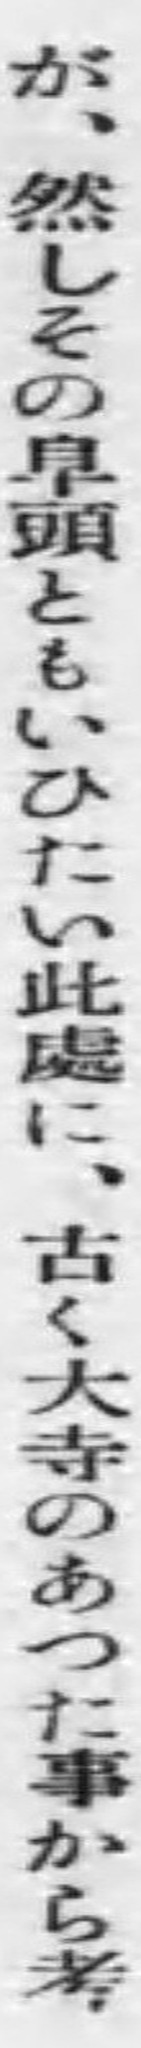が、然しその阜頭ともいひたい此処に、古く大寺のあつた事から考
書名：東三河道中記 : 豊橋市及其附近案内
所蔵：国立国会図書館 National Diet Library, JAPAN
